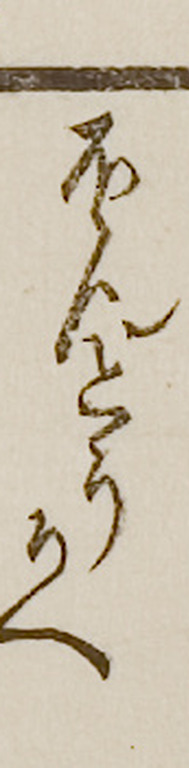ほんとうかね
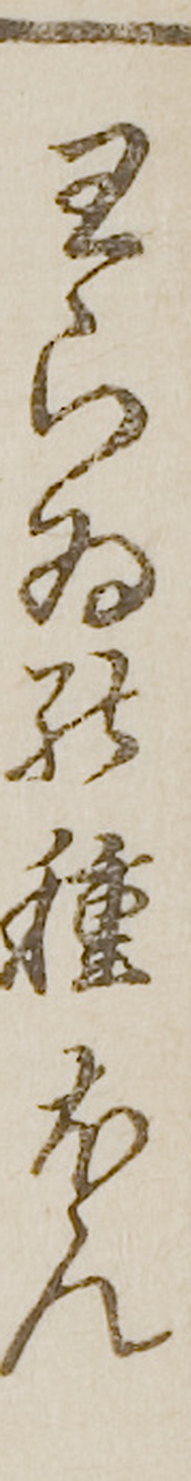わらいの種ほん
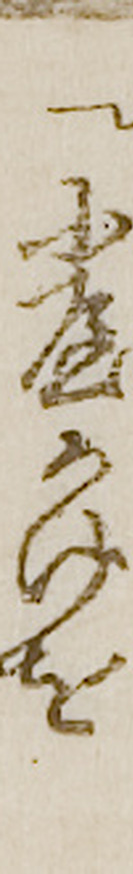〽小屋かけを
